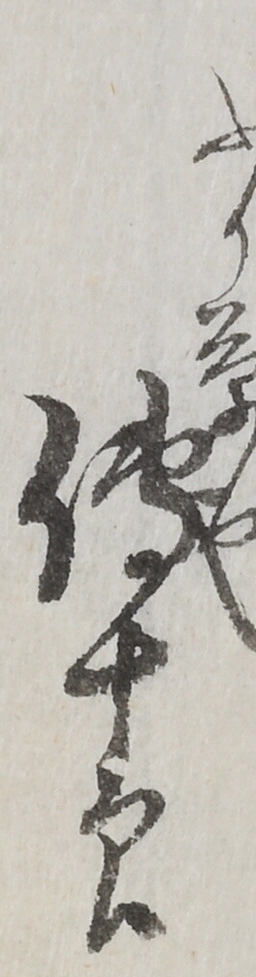伝十郎
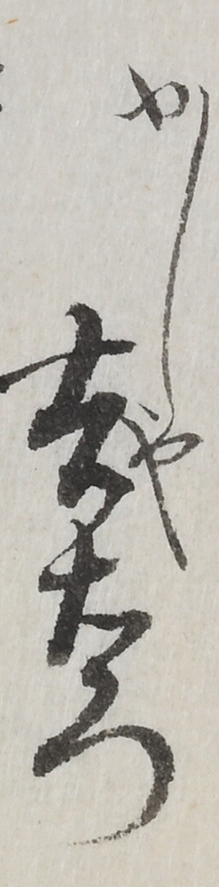吉右衛門
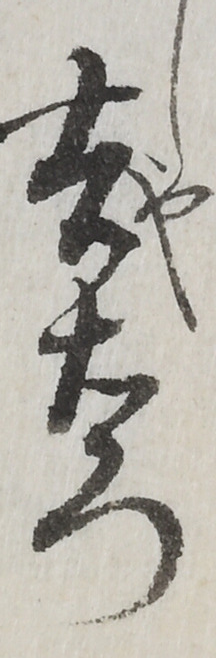吉右衛門
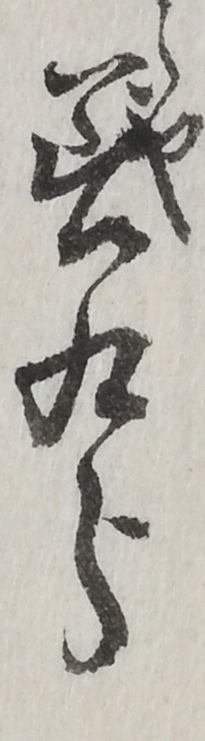善九郎
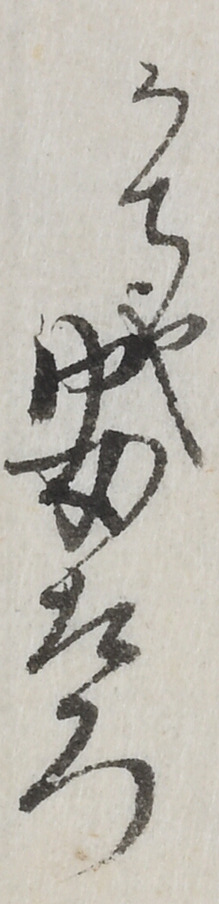安左衛門
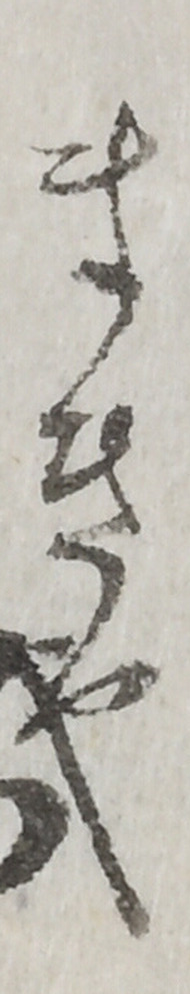まきや
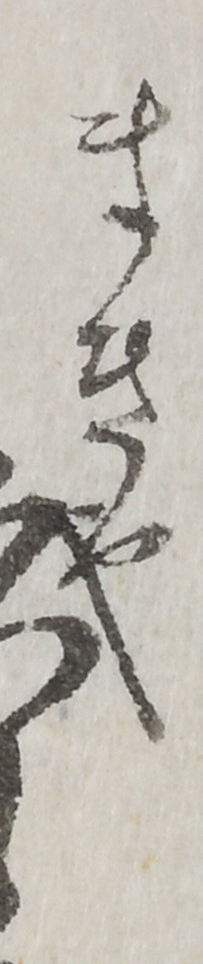まきや
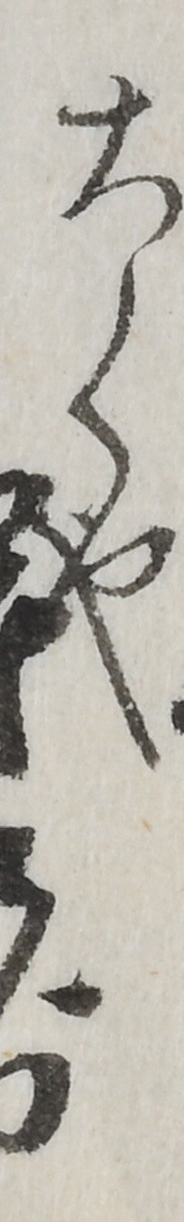大くや
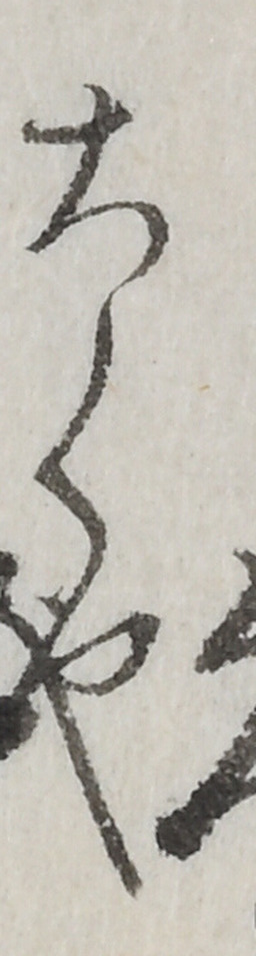大くや
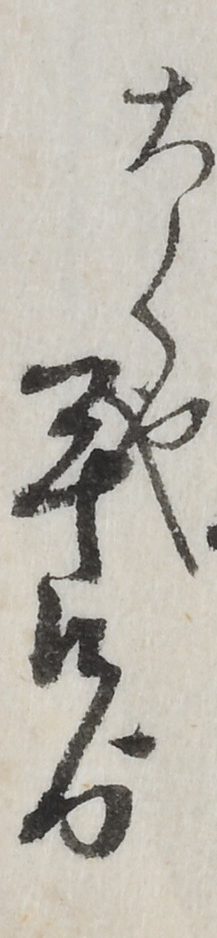平左衛門
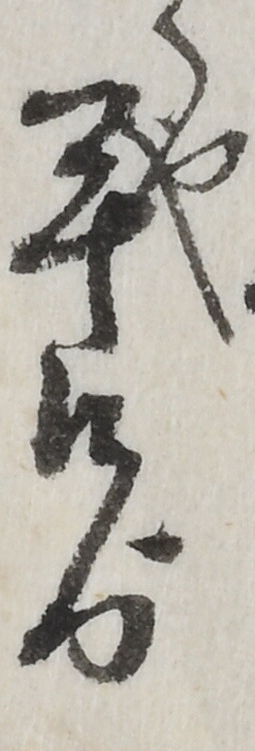平左衛門

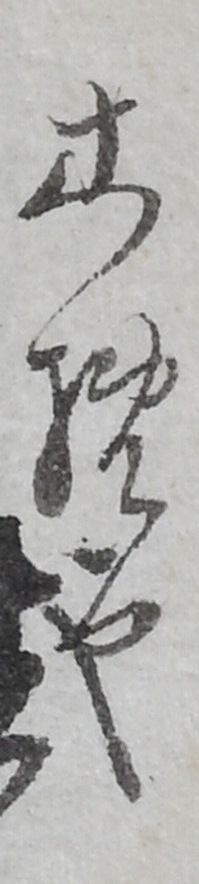木綿や
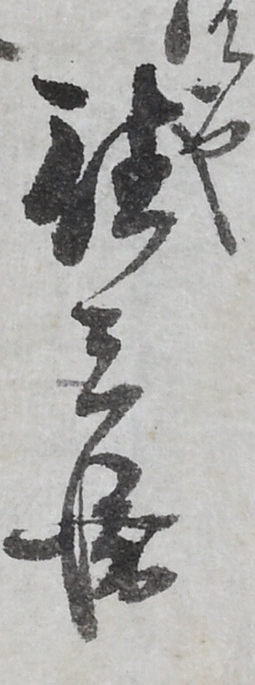徳兵衛
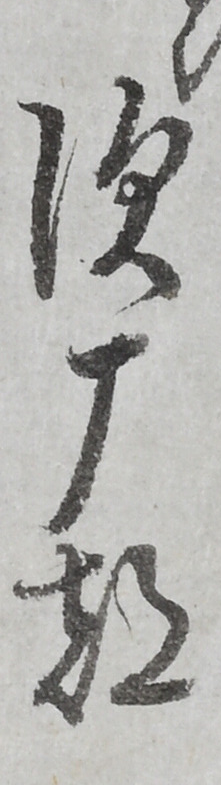須摩都
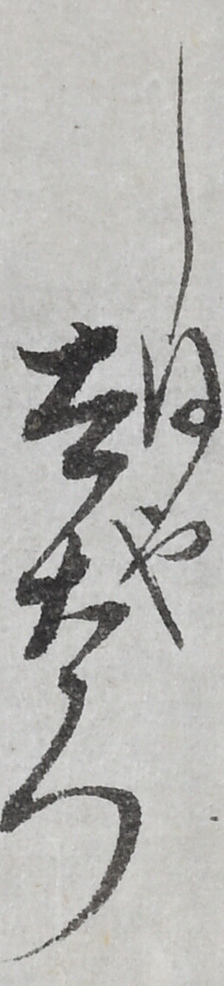吉右衛門
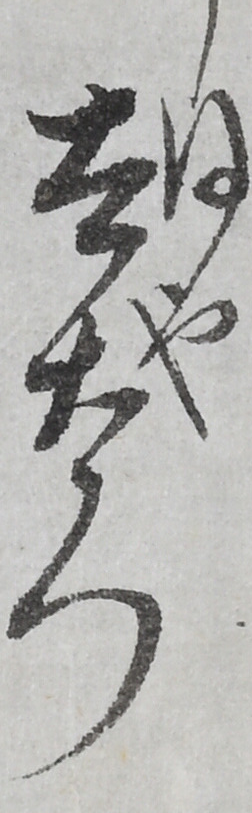吉右衛門
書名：當町火消道具幷役附帳
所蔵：伊那市立高遠町図書館・合同会社AMANE
